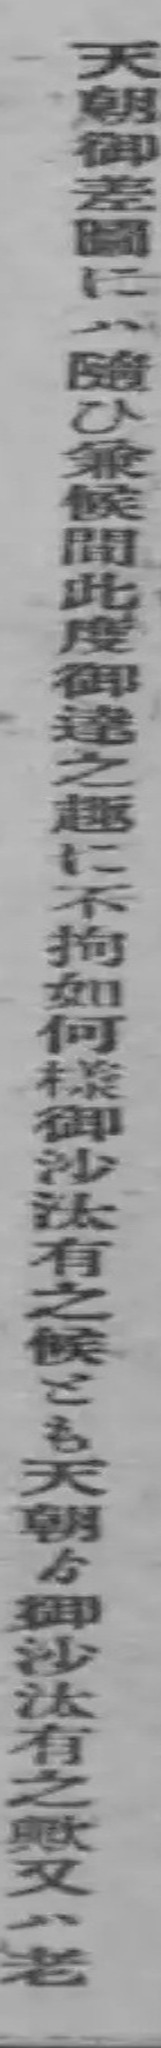天朝御差図にハ随ひ兼候間此度御達之趣に不拘如何様御御沙汰有之候とも天朝ゟ御沙汰之歟又ハ老
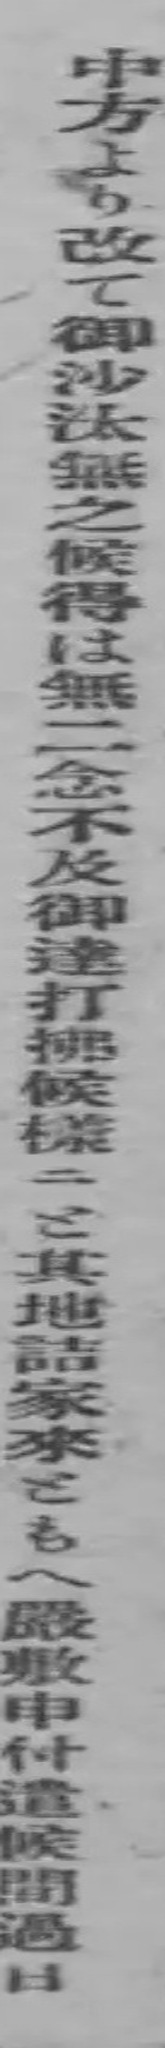中方より改て御沙汰無之候得は無二念不及御達打払候様ニと其地詰家来ともへ厳敷申付遣候間過日
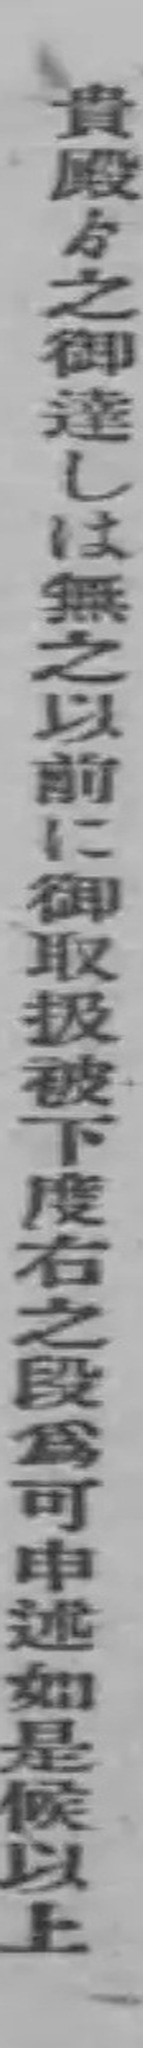貴殿ゟ之御達しは無之以前に御取扱被下度右之段為可申述如是候以上
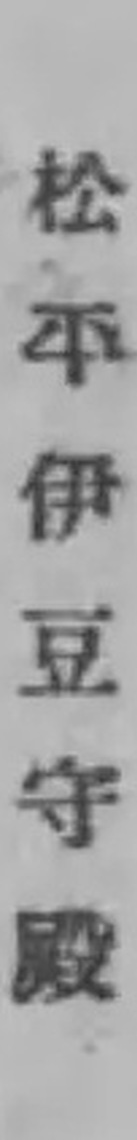松平伊豆守殿
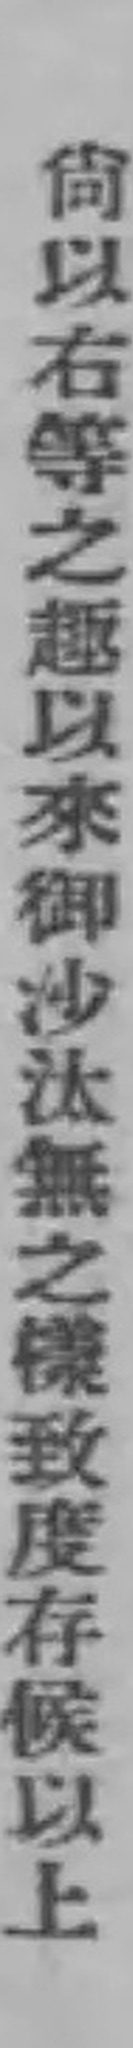尚以右等之趣以来御沙汰無之様致度存候以上
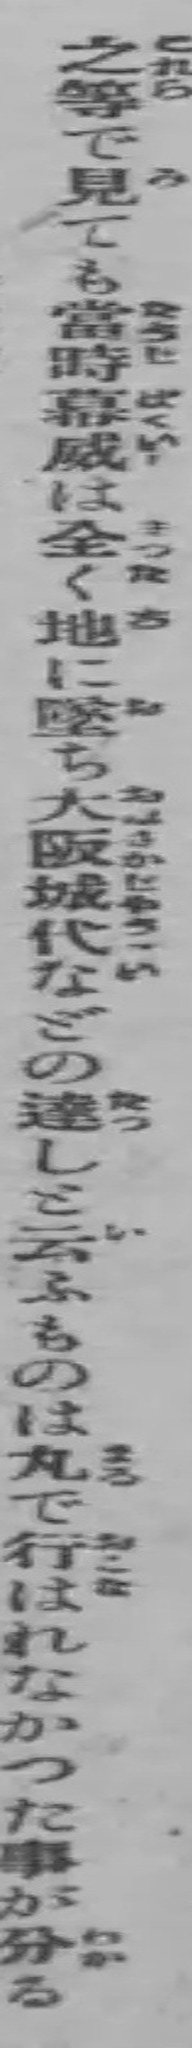之等で見ても当時幕威は全く地に墜ち大阪城代などの達しと云ふものは丸で行はれなかつた事が分る
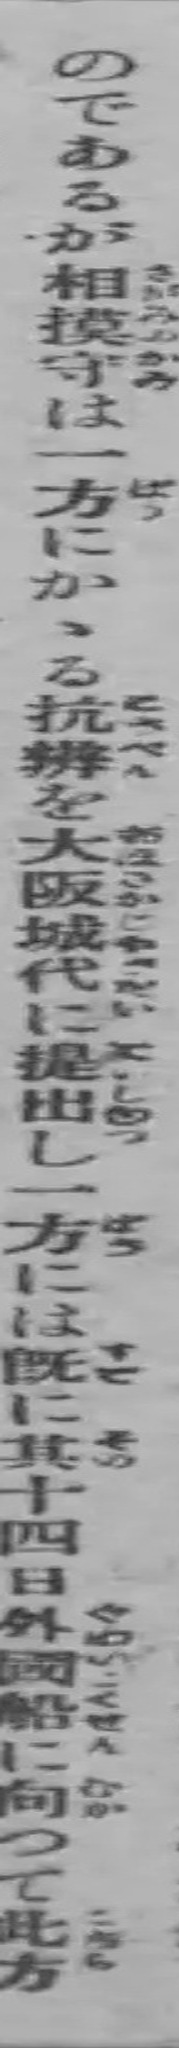のであるが相摸守は一方にかゝる抗弁を大阪城代に提出し一方には既に其十四日外国船に向つて此方
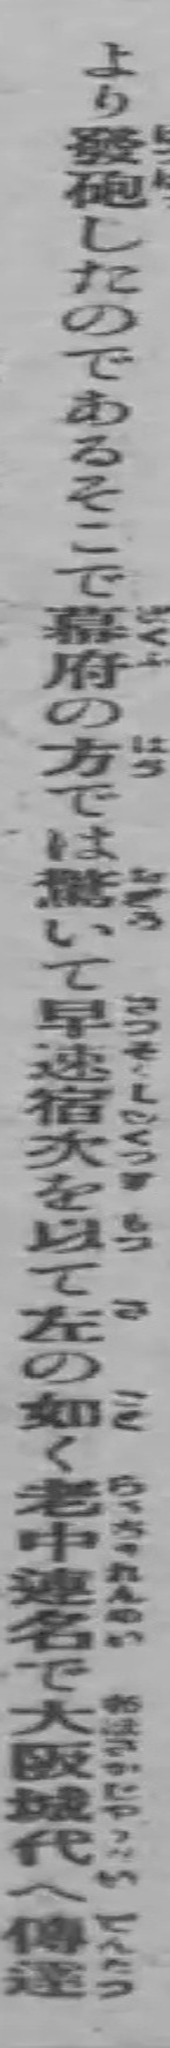より発砲したのであるそこで幕府の方では驚いて早速宿次を以て左の如く老中連名で大阪城代へ伝達
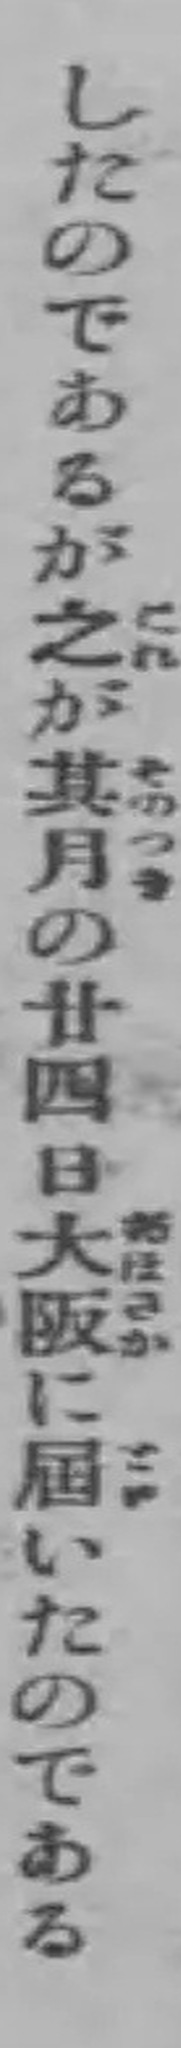したのであるが之が其月の廿四日大阪に届いたのである
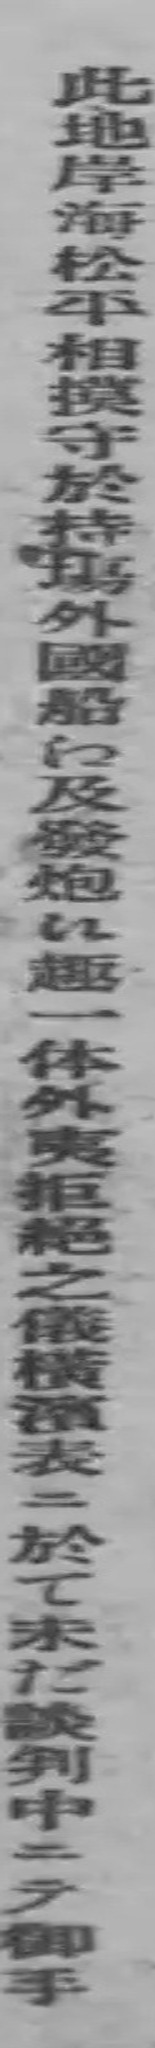此地岸海松平相摸守於持場外国船え及発砲候趣一体外夷拒絶之儀横浜表ニ於て未だ談判中ニテ御手
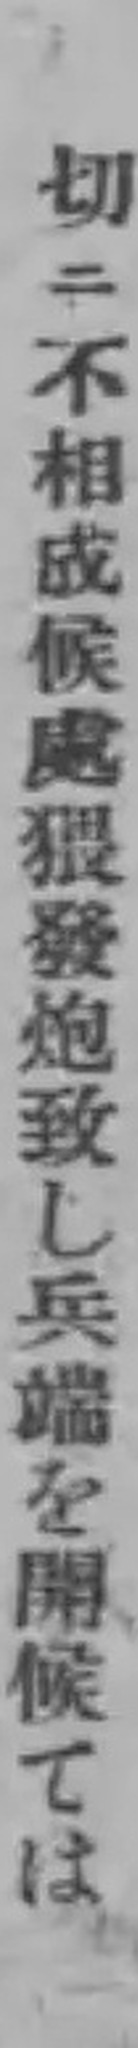切ニ不相成候処猥発砲致し兵端を開候ては
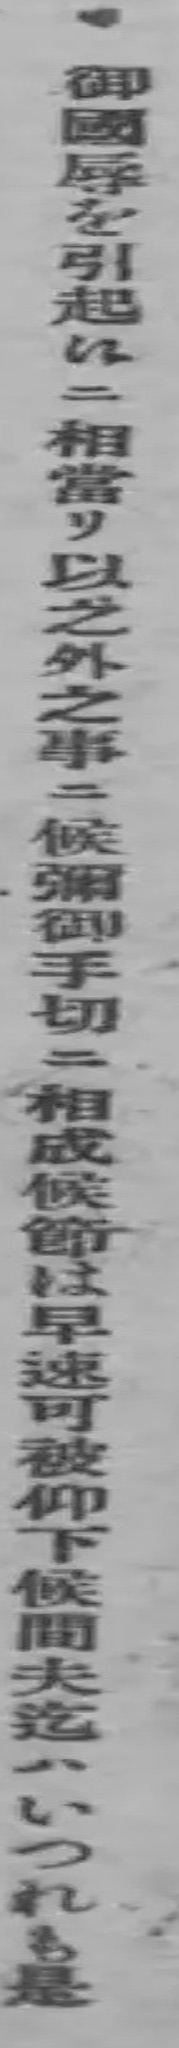御国辱を引起候ニ相当リ以之外之事ニ候弥御手切ニ相成候節は早速可被仰下候間夫迄ハいつれも是
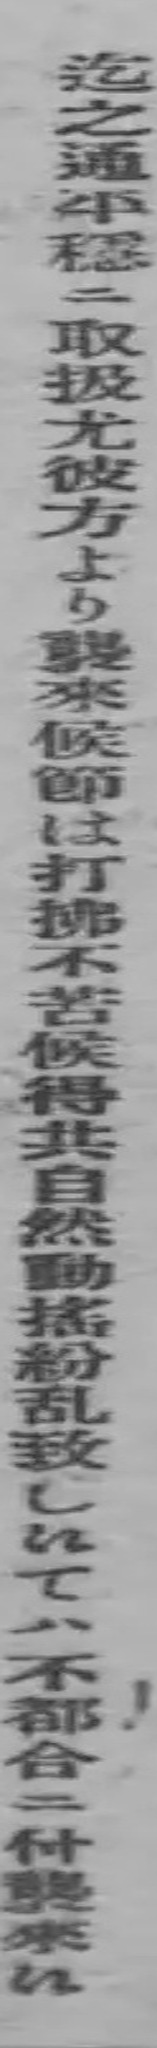迄之通平穏ニ取扱尤彼方より襲来候節は打払不苦候得共自然動揺紛乱致し候てハ不都合ニ付襲来候
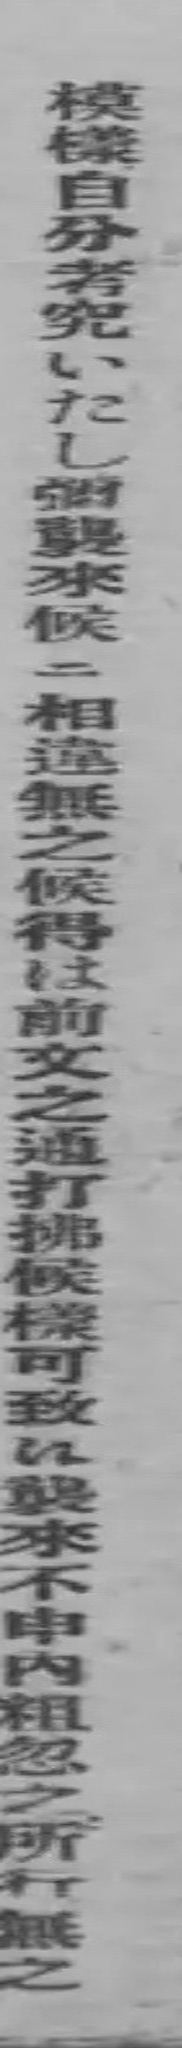模様自分考究いたし弥襲来候ニ相違無之様得は前文之通打払候様可致候襲来不申内粗忽之所行無之
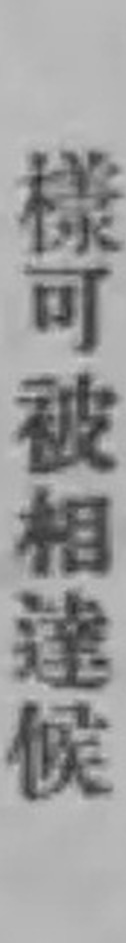様可被相達候
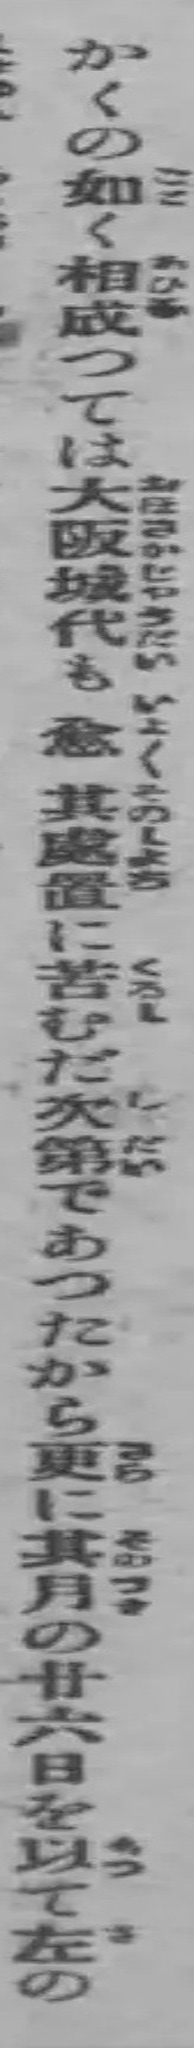かくの如く相成つては大阪城代も愈其処置に苦むだ次第であつたから更に其月の廿六日を以て左の
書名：豊橋市史談
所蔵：国立国会図書館 National Diet Library, JAPAN
